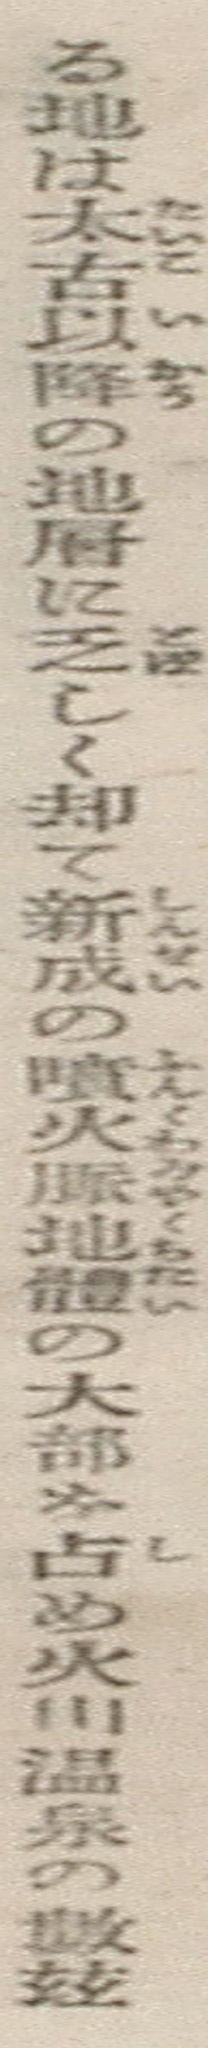る地は太古以降の地層に乏しく却て新成の噴火脈地體の大部を占め火川温泉の数茲
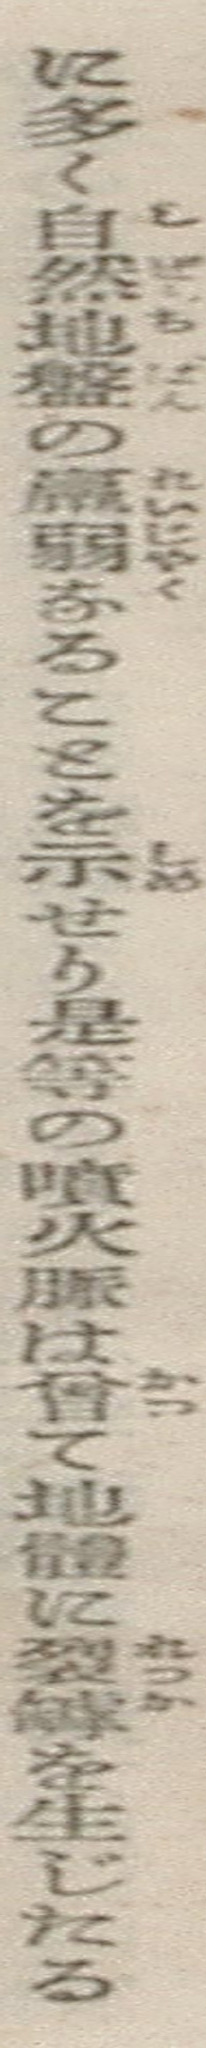に多く自然地盤の麗弱なることを示せり是等の噴火脈は曾て地體に裂罅を生じたる
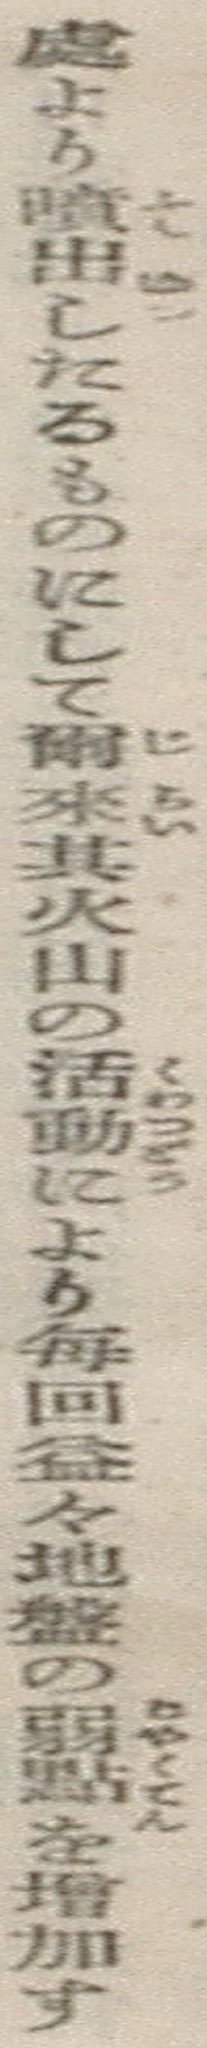処より噴出したるものにして爾来其火山の活動により毎回益々地盤の弱点を増加す
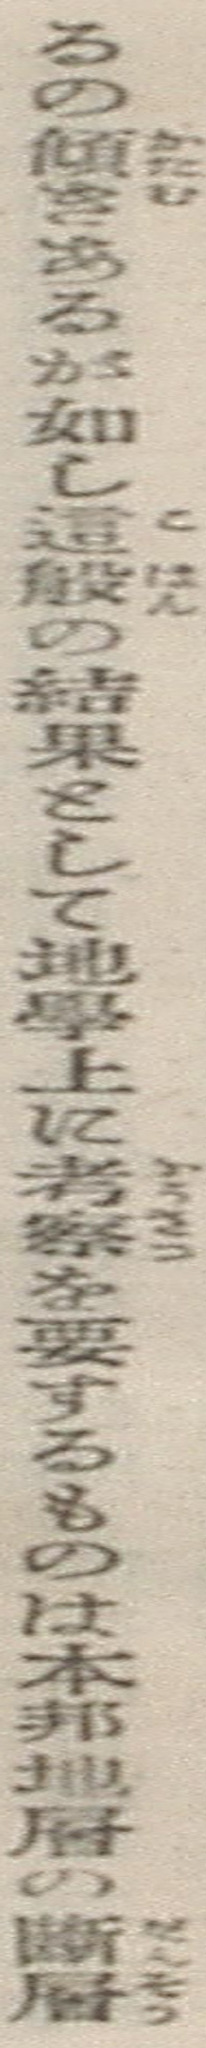るの傾きあるが如し這般の結果として地学上に考察を要するものは本邦地層の断層
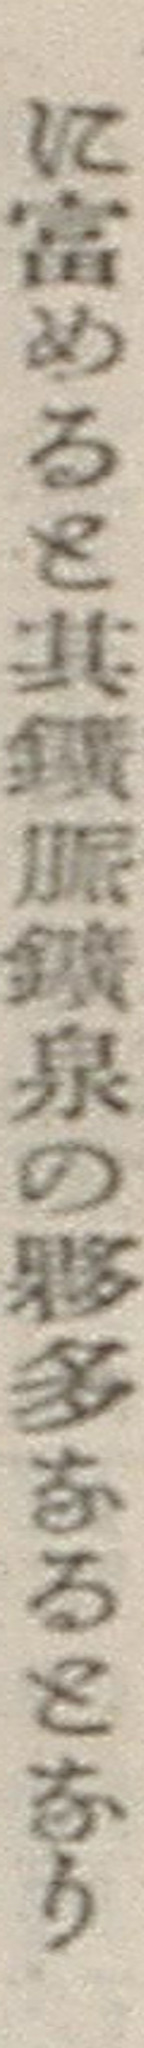に富めると其鉱脈鉱泉の夥多なるとなり
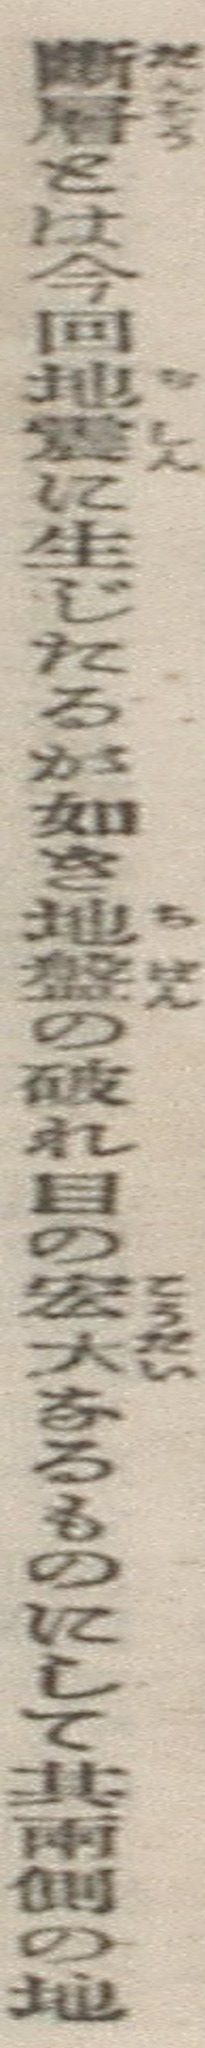断層とは今回地震に生じたるが如き地盤の破れ目の宏大なるものにして其両側の地
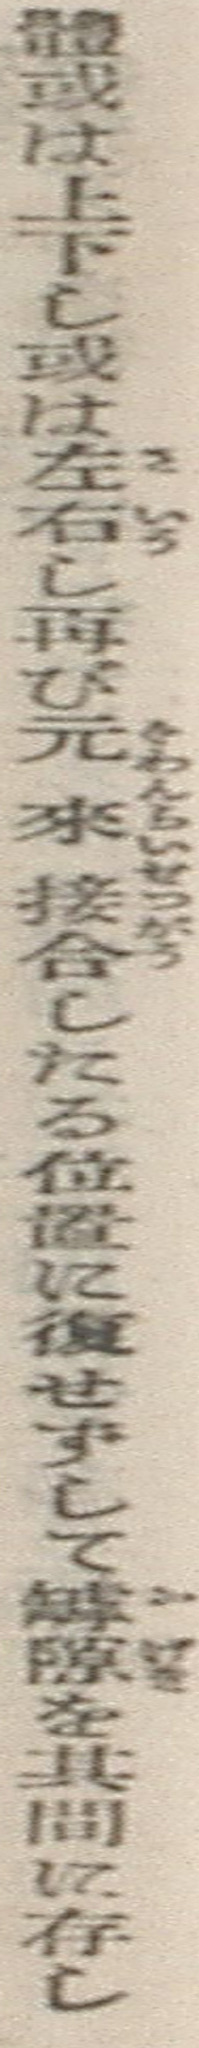體或は上下し或は左右し再び元来接合したる位置に復せずして罅隙を其の間に存し
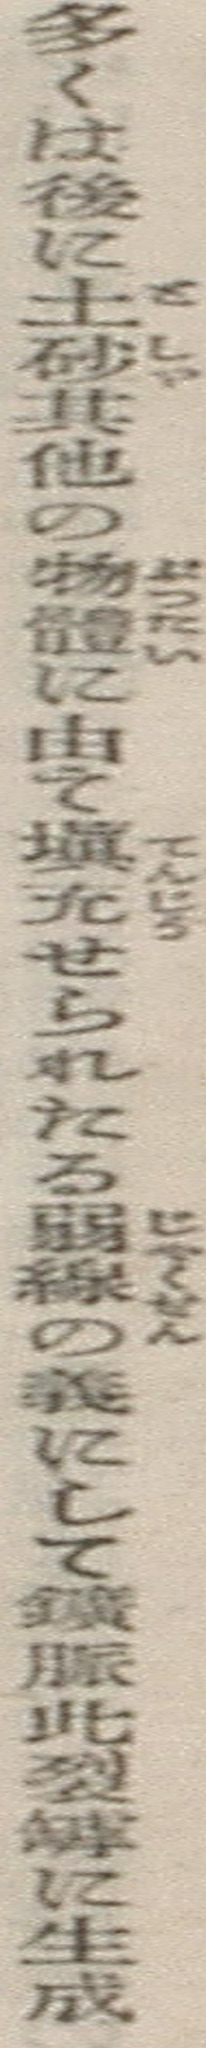多くは後に土砂其他の物體に由て填充せられたる弱線の義にして鉱脈此裂罅に生成
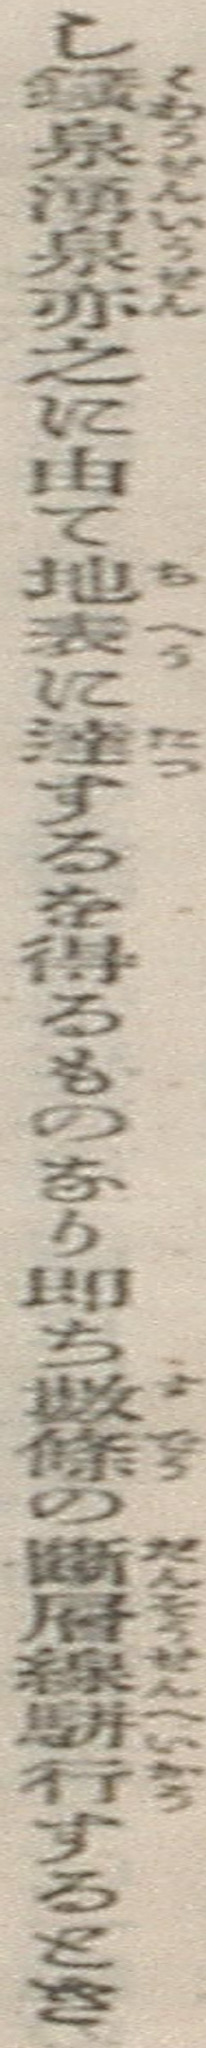し鉱泉湧泉亦之に由て地表に達するを得るものなり即ち数條の断層線駢行するとき
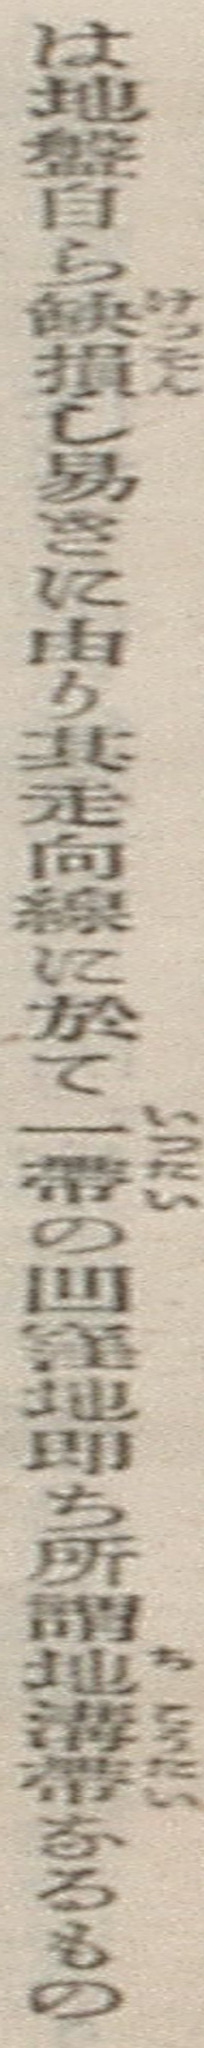は地盤自ら缺損し易きに由り其の走向線に於て一帯の凹窪地即ち所謂地溝帯なるもの
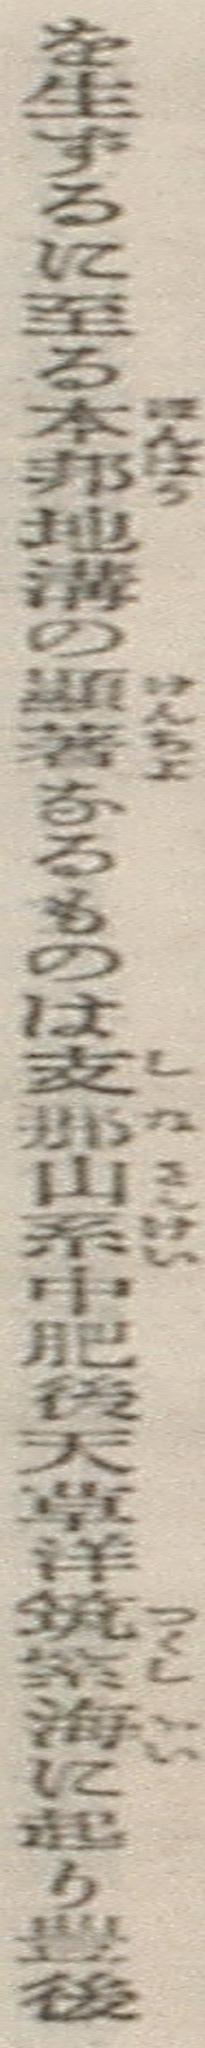を生ずるに至る本邦地溝の顕著なるものは支那山系中肥後天草洋筑紫海に起り豊後
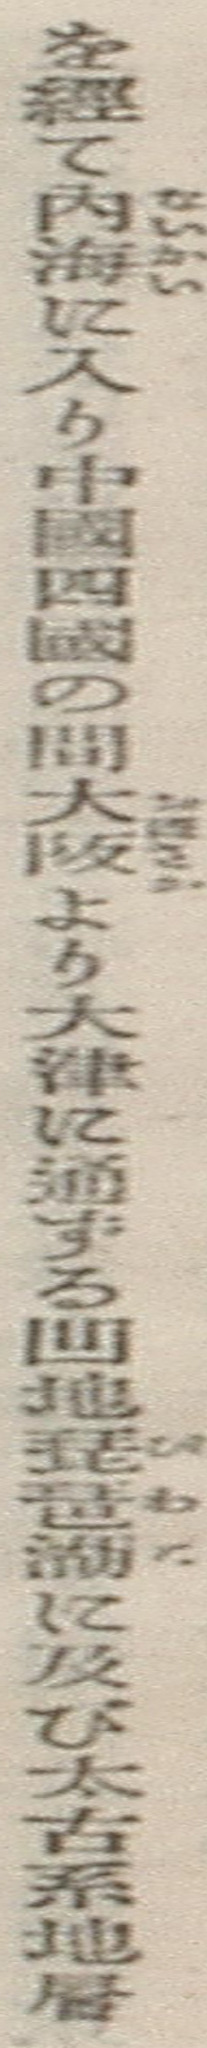を経て内海に入り中国四国の間大阪より大津に通ずる凹地琵琶湖に及び太古系地層
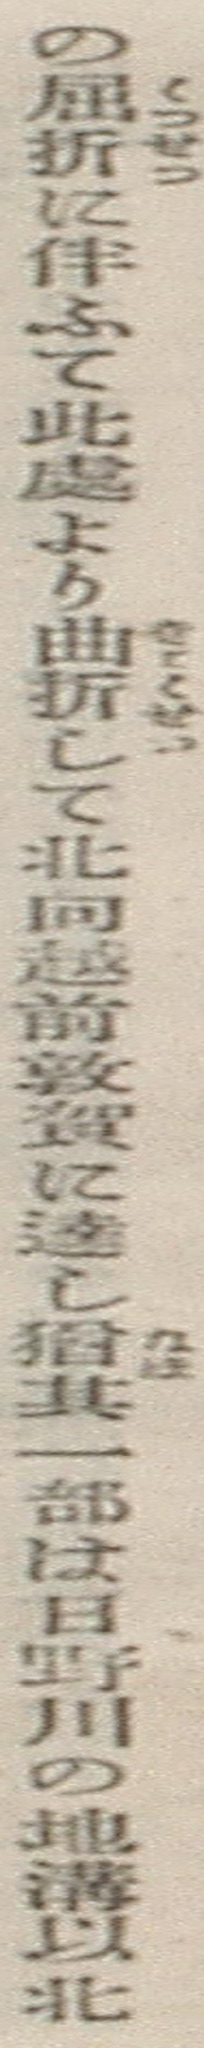の屈折に伴ふて此処より曲折して北回越前敦賀に達し猶其一部は日野川の地溝以北
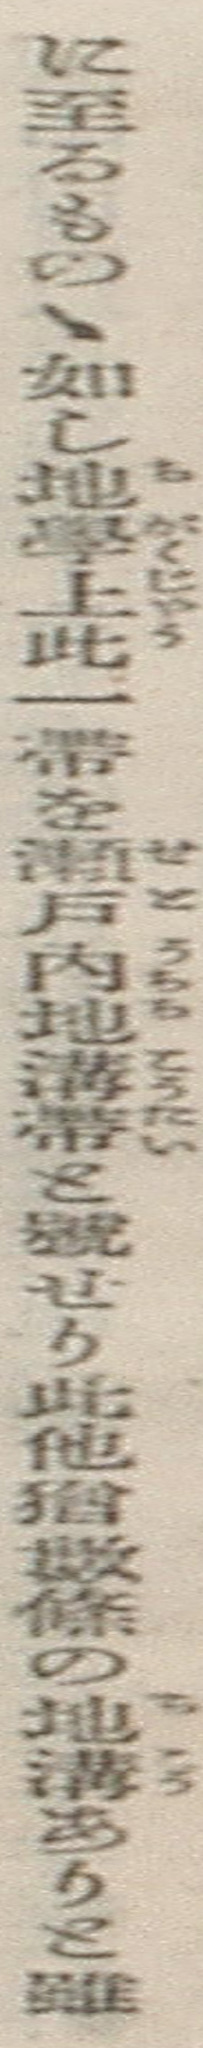に至るものゝ如し地学上此一帯を瀬戸内地溝帯と号せり此他猶数條の地溝ありと雖
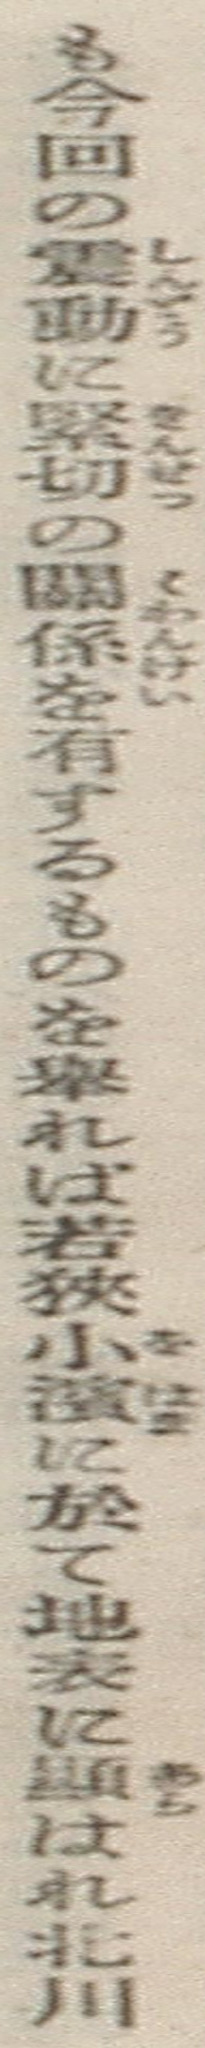も今回の震動に緊切の関係を有するものを挙れば若狭小浜に於て地表に顕はれ北川
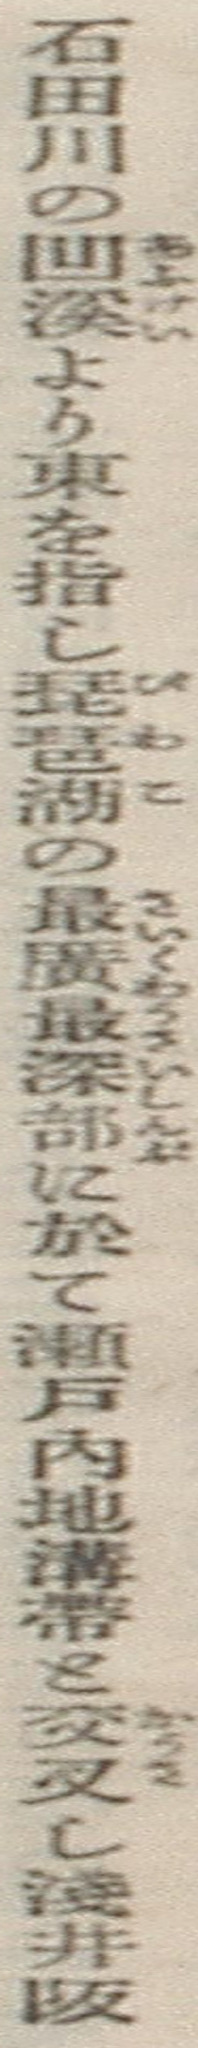石田川の凹渓より東を指し琵琶湖の最廣最深部に於て瀬戸内地溝帯と交叉し浅井阪
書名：愛知岐阜福井三県　大地震見聞録（内題）
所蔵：東京大学地震研究所図書室 Earthquake Research Institute Library, The University of Tokyo, JAPAN
